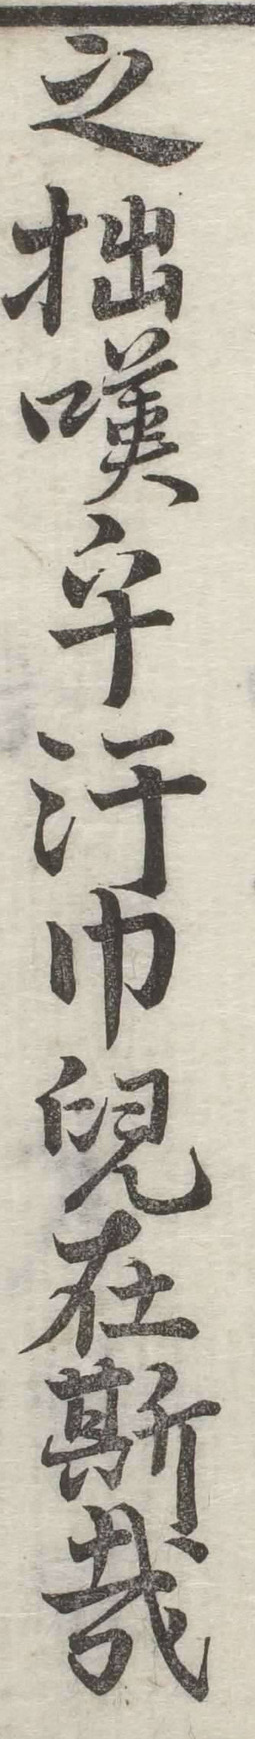之拙嘆乎汗巾児在斯哉
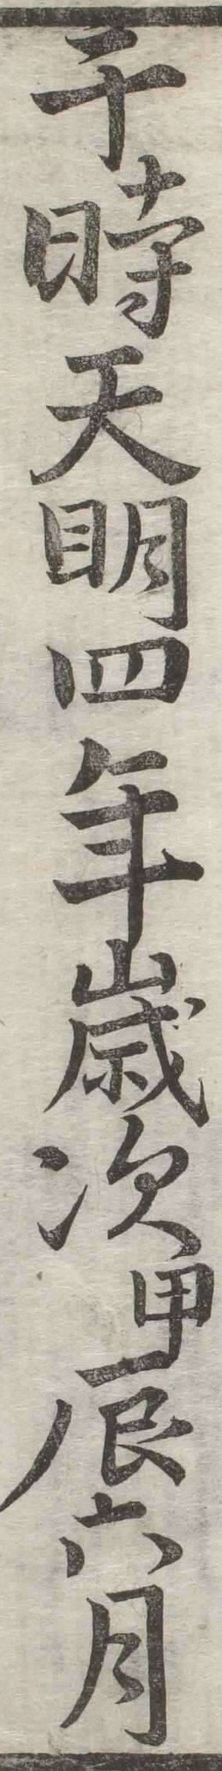于時天明四年歳次甲辰六月
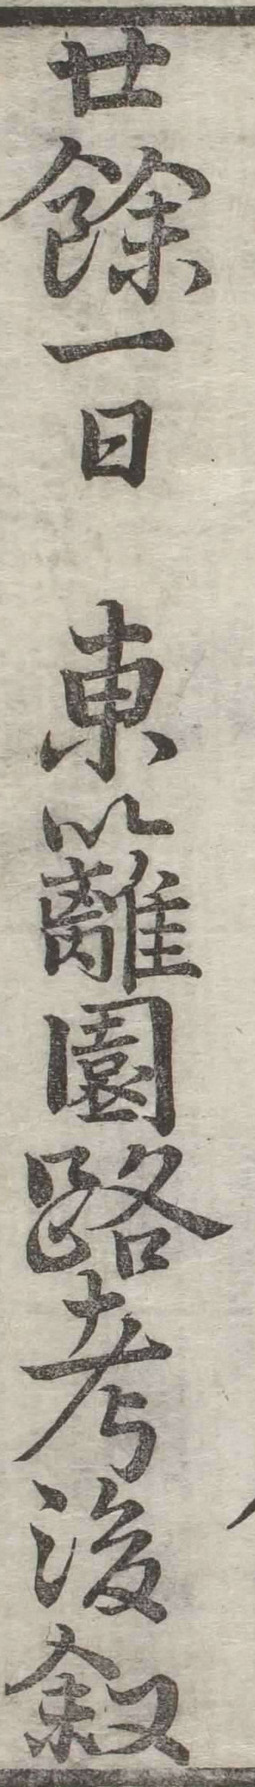廿余一日東籬園路考後叙

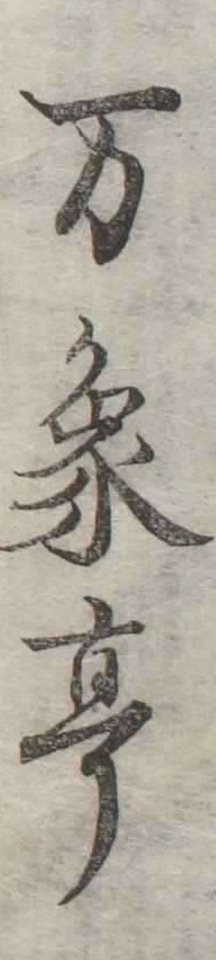万象亭
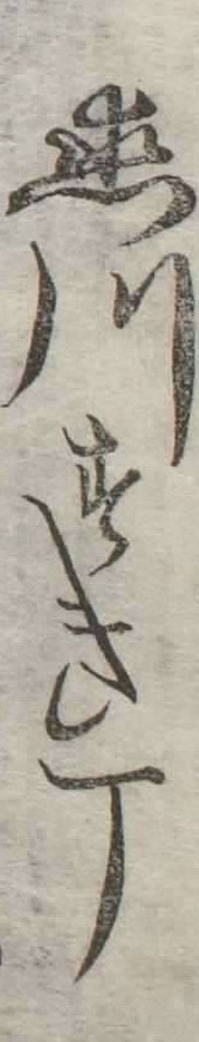恋川すき丁
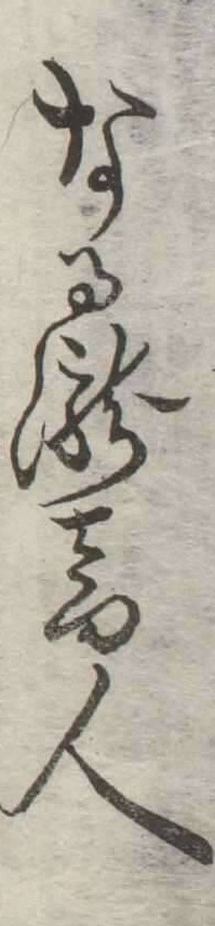なる瀧音人
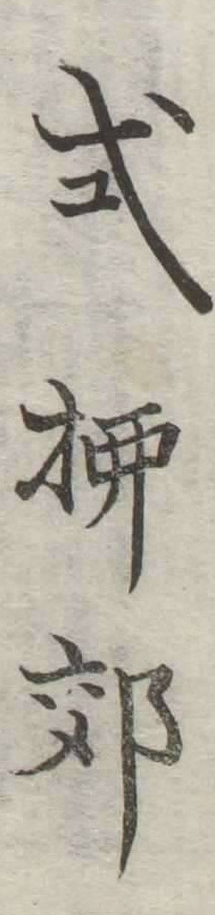式柳郊
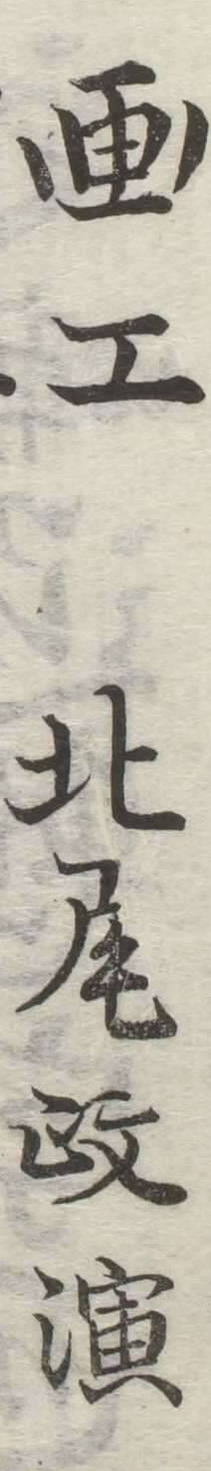画工北尾政演
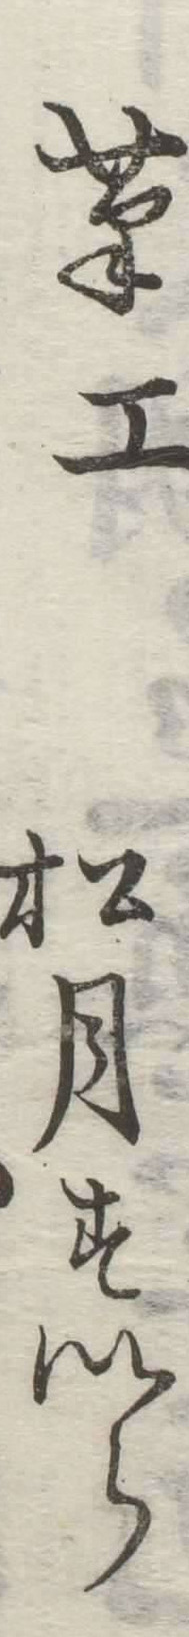筆工松月すいら
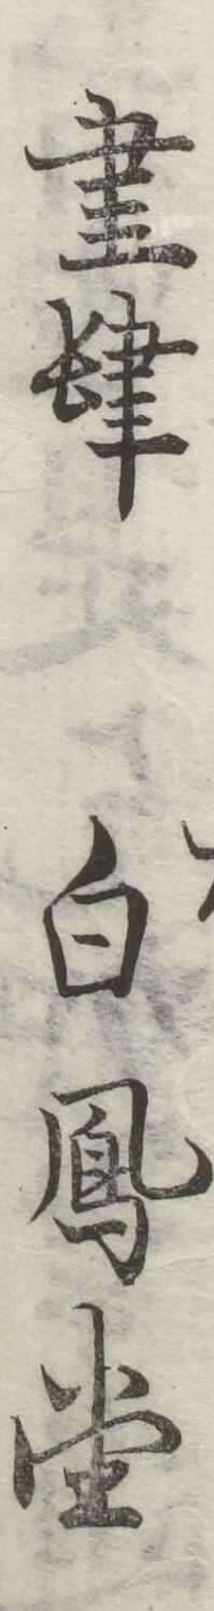書肆白鳳堂
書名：たなくひあわせ
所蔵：国文学研究資料館
